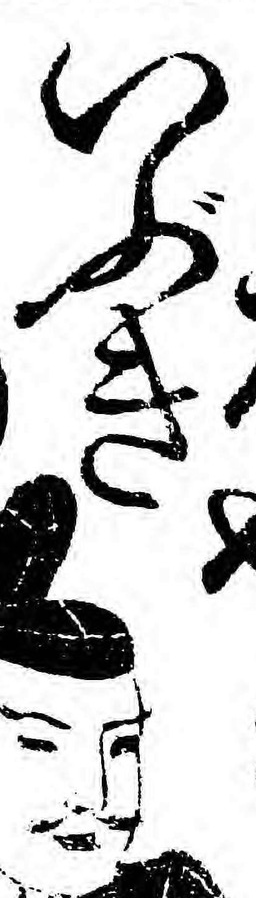いぶき
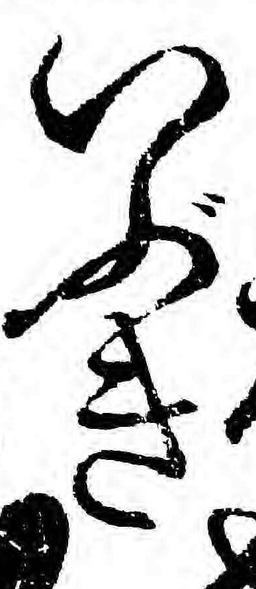いぶき
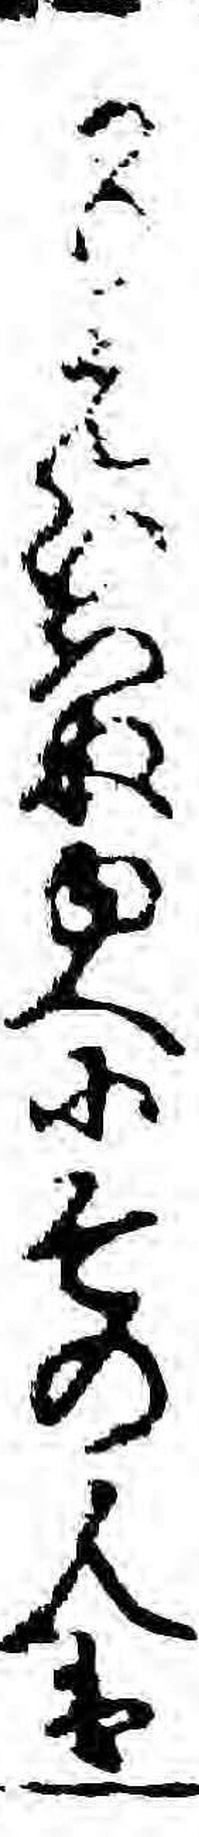かりえいはぬゆへにその人は
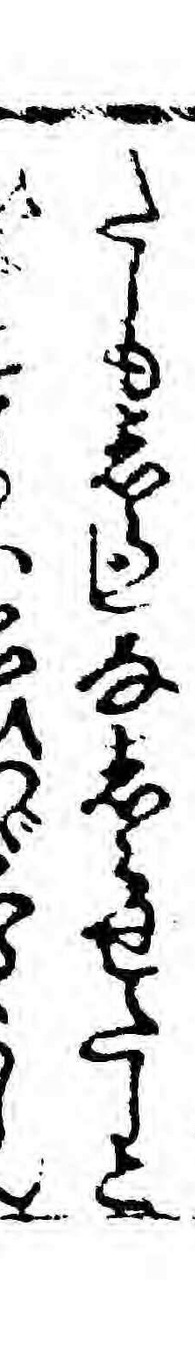さしもしらじなしらせたしと
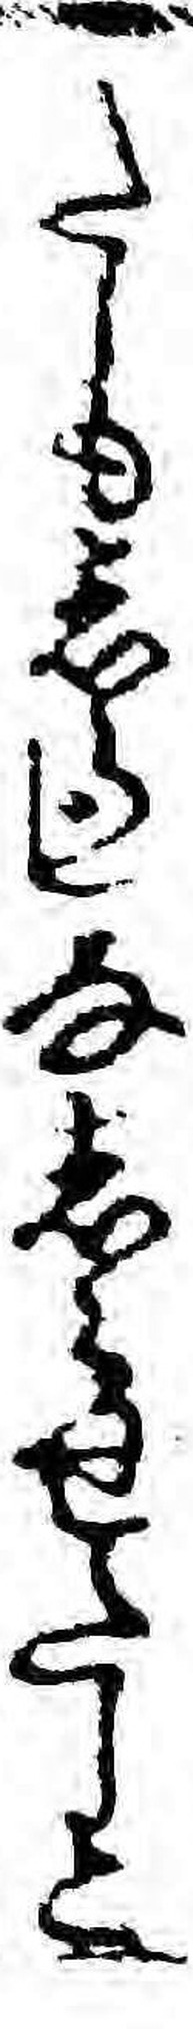さしもしらじなしらせたしと
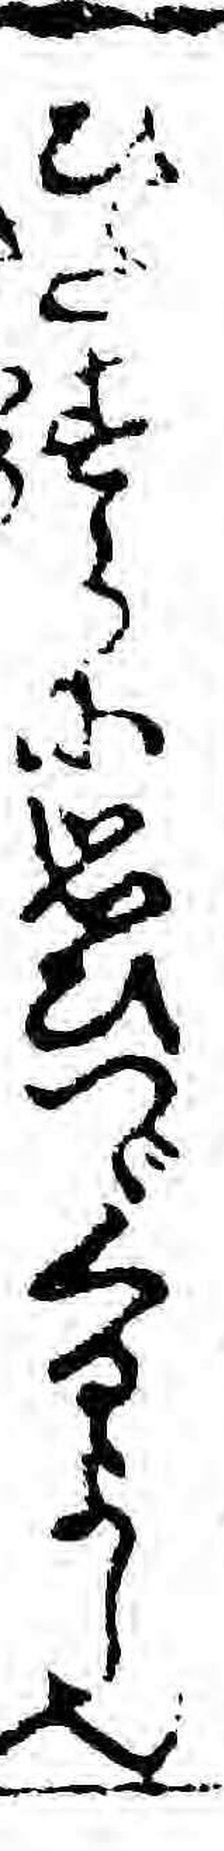ひたすらに思ひつゞくるよし也
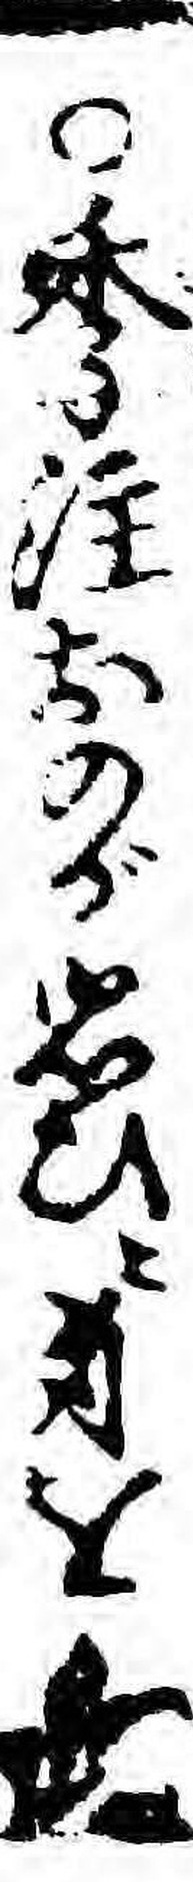〇季注おのが思ひに身を
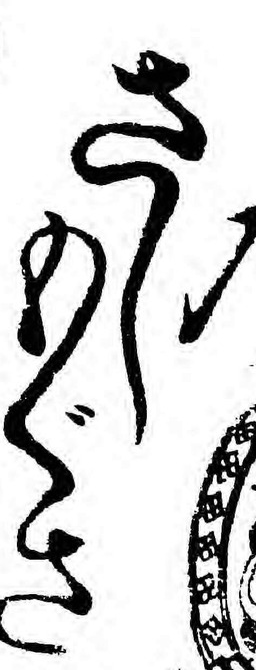さしもぐさ
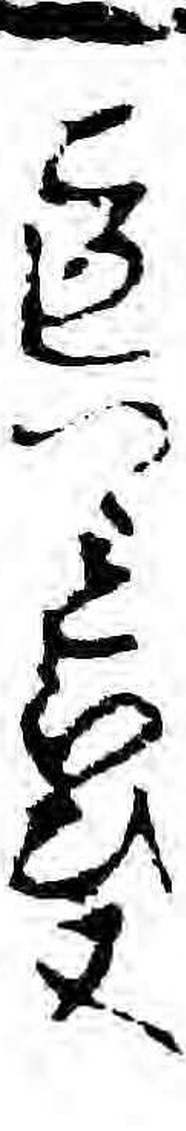こかしつゝといひ又
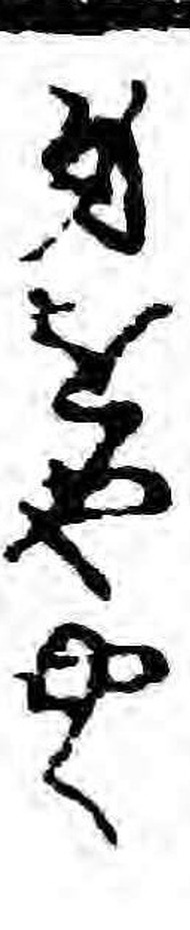身をややく
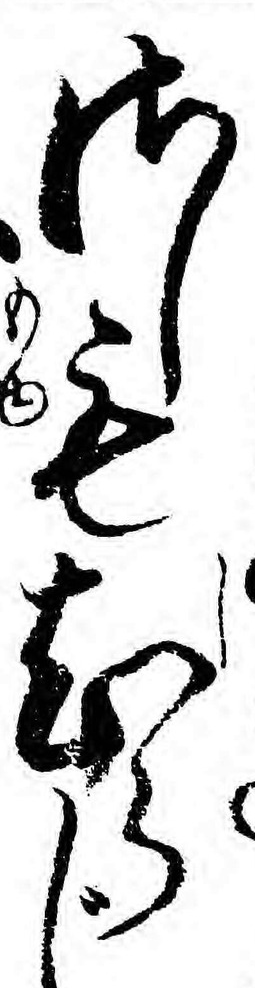さしも知らじな
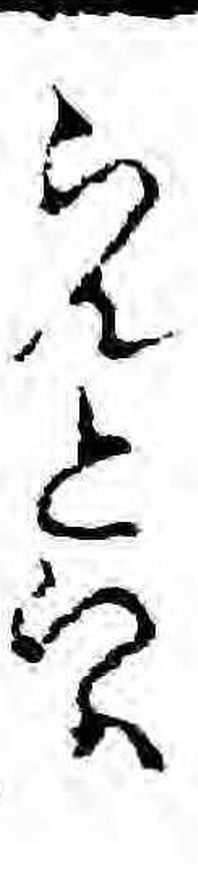らんといふ
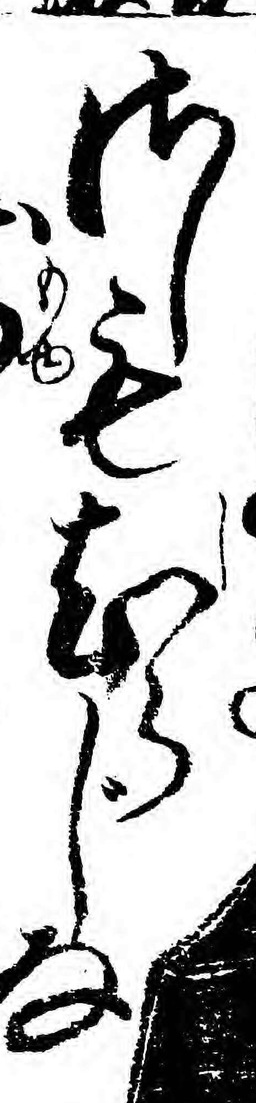さしも知らじな
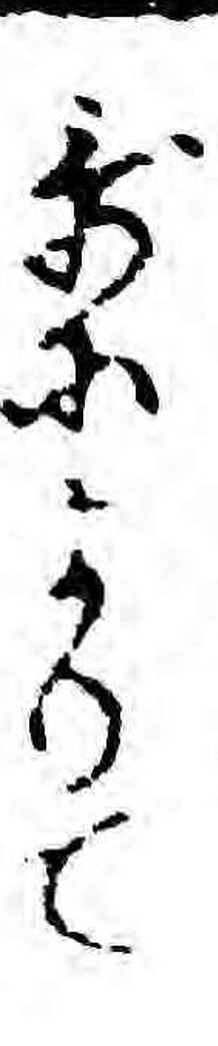哥によりて
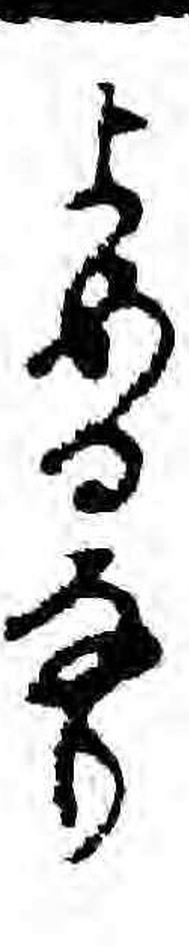よめるなり
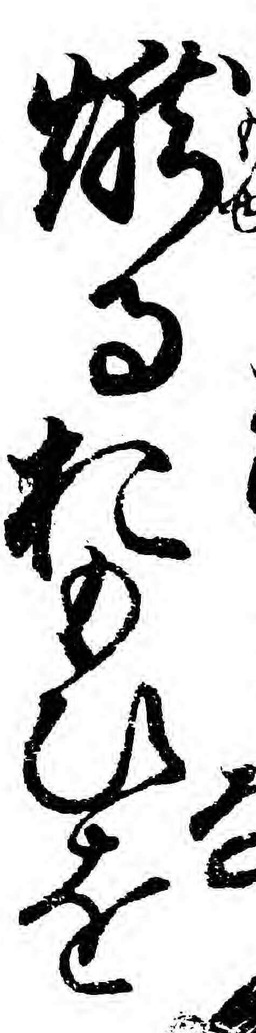燃るおもひを
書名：頭書和歌注譯／壽賀多百人一首小倉錦
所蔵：国文学研究資料館
